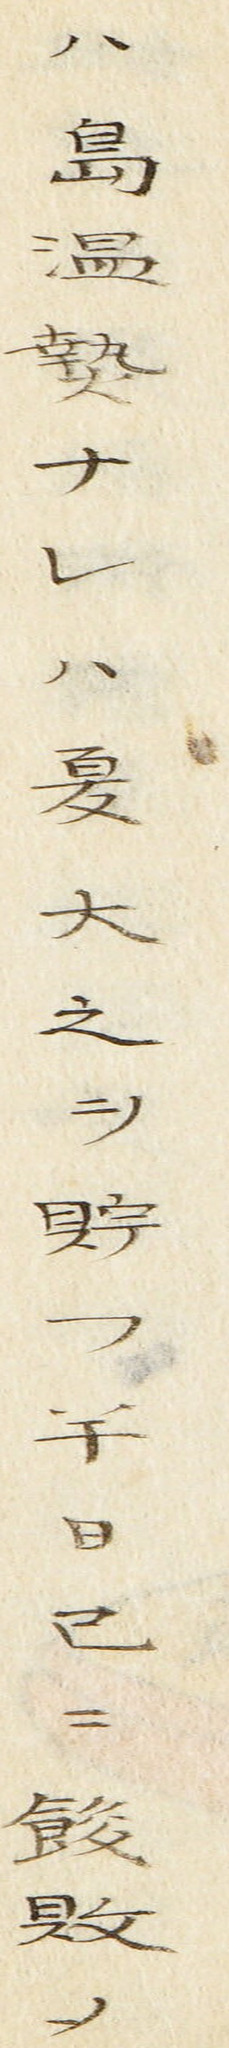ハ島温熱ナレハ夏大之ヲ貯フ半日已ニ餕敗シテ
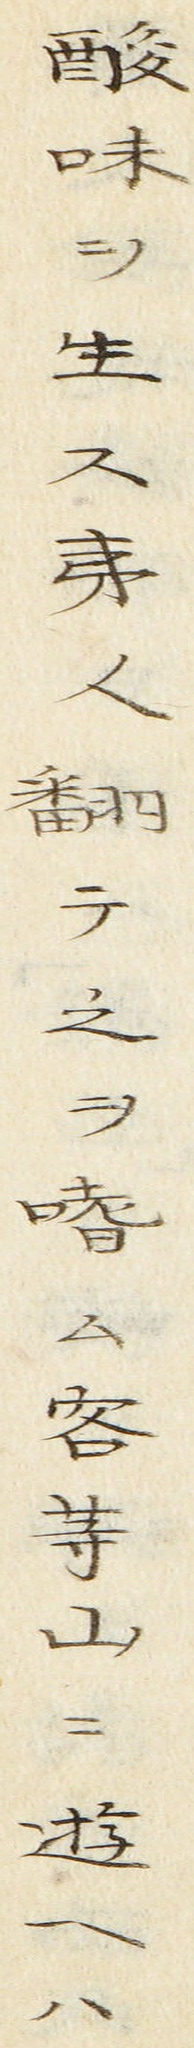酸味ヲ生ス夷人翻テ是ヲ嗜ム客等山ニ遊ヘハ

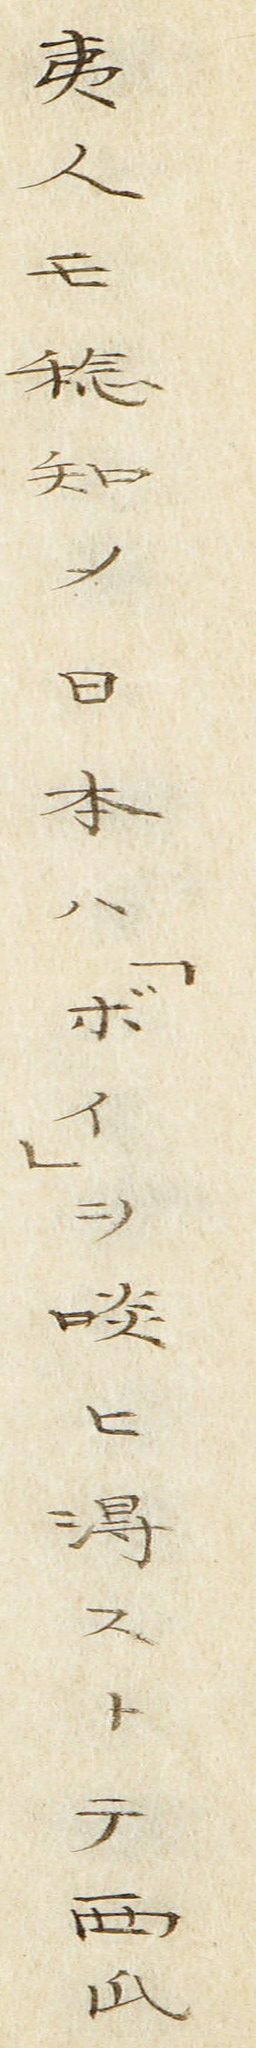夷人モ稔知シテ日本ハ「ボイ」ヲ啖ヒ淂ストテ西瓜
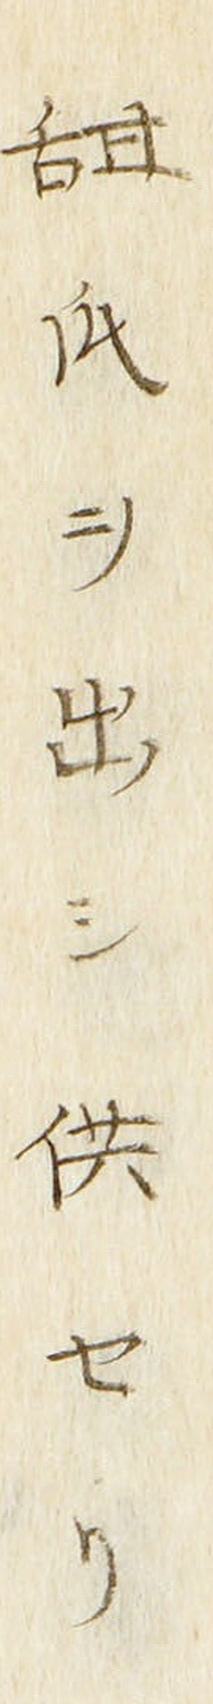甜瓜ヲ出シ供セリ
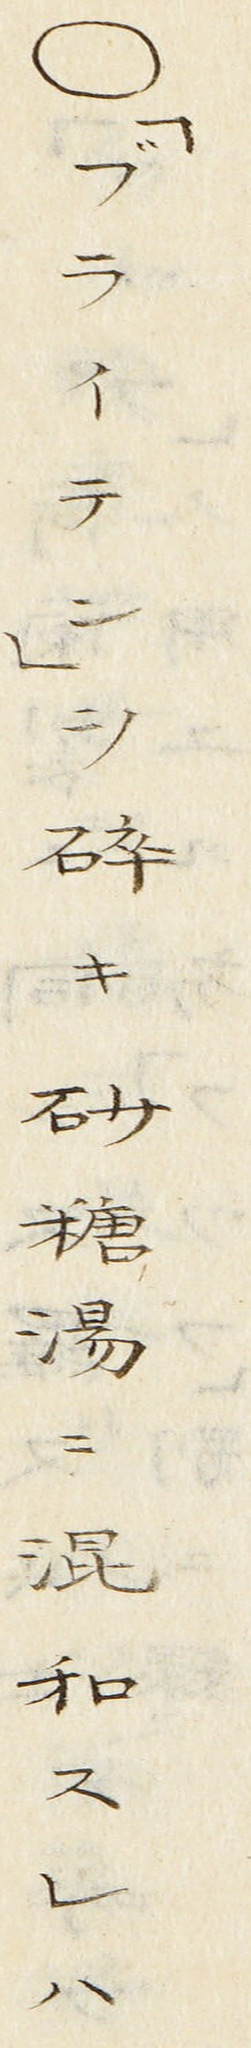〇「ブライテン」ヲ砕キ砂糖湯ニ混和スレハ
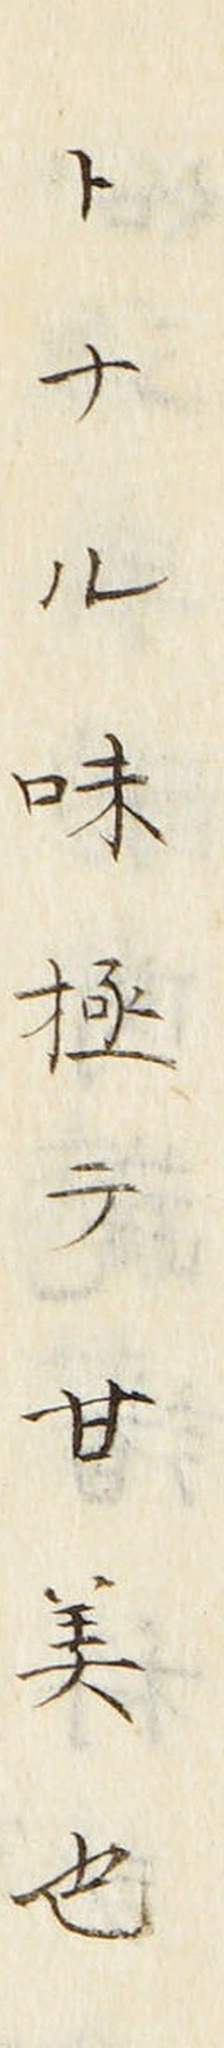トナル味極テ甘美也
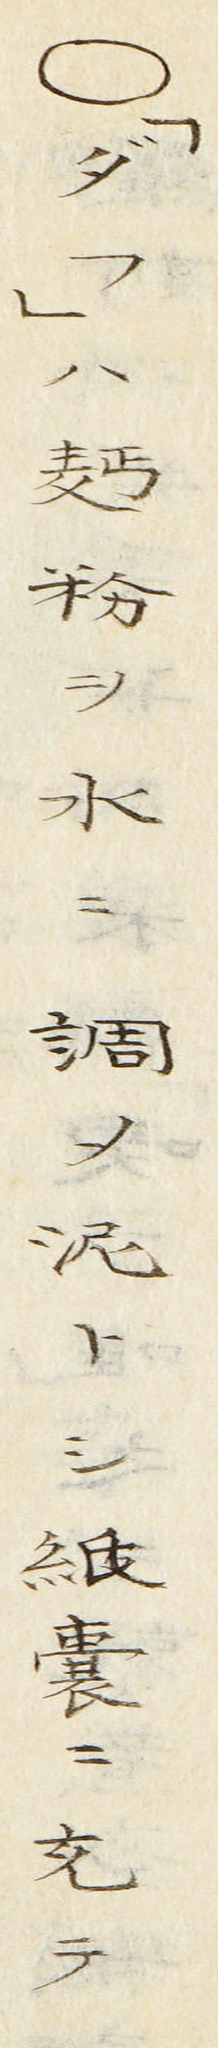〇「ダフ」ハ麪？粉ヲ水ニ調シテ泥トシ紙嚢ニ充テ
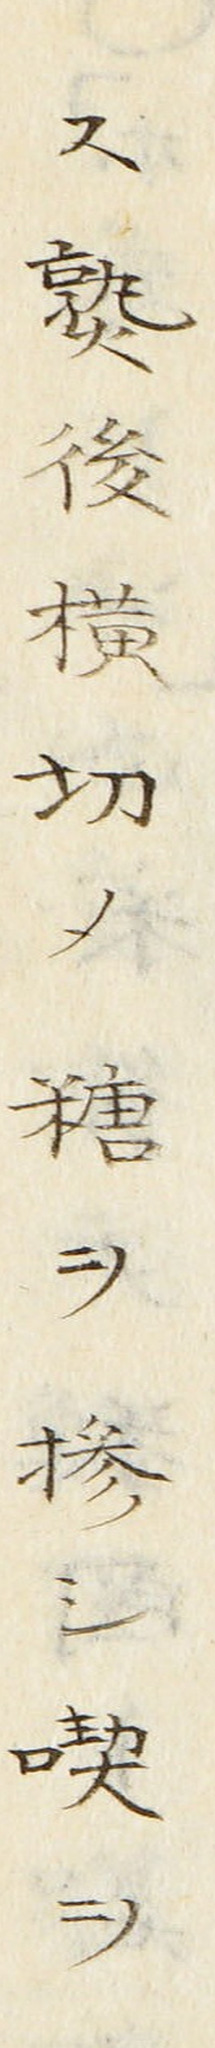ス熱後横切シテ糖ヲ摻シ喫ヲ
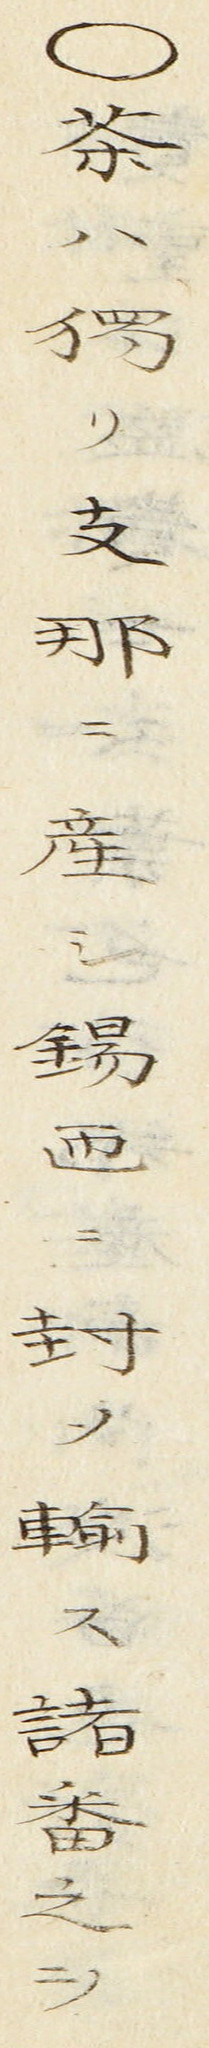〇茶ハ獨リ志支那ニ産シ錫ニ対シテ輸ス諸番之ヲ

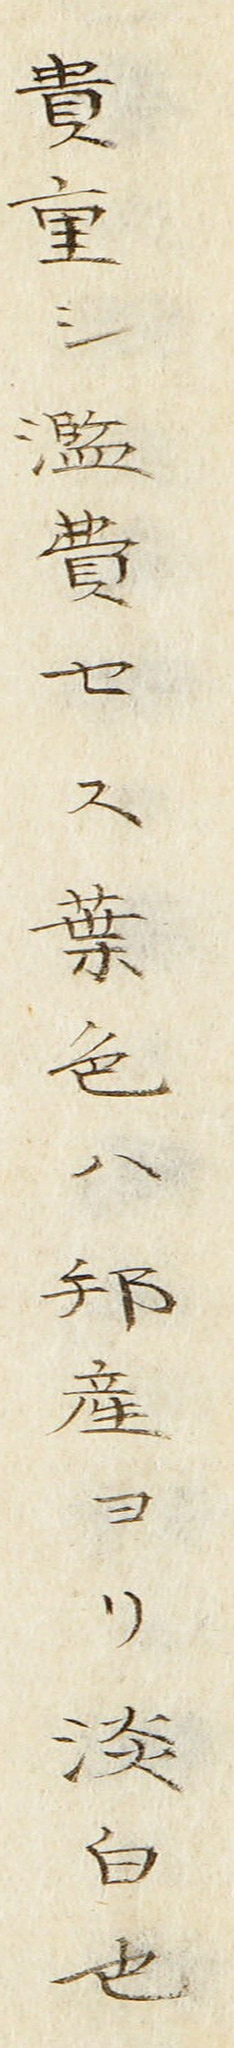貴重シ卵濫費セス葉色ハ邦産ヨリ淡白也
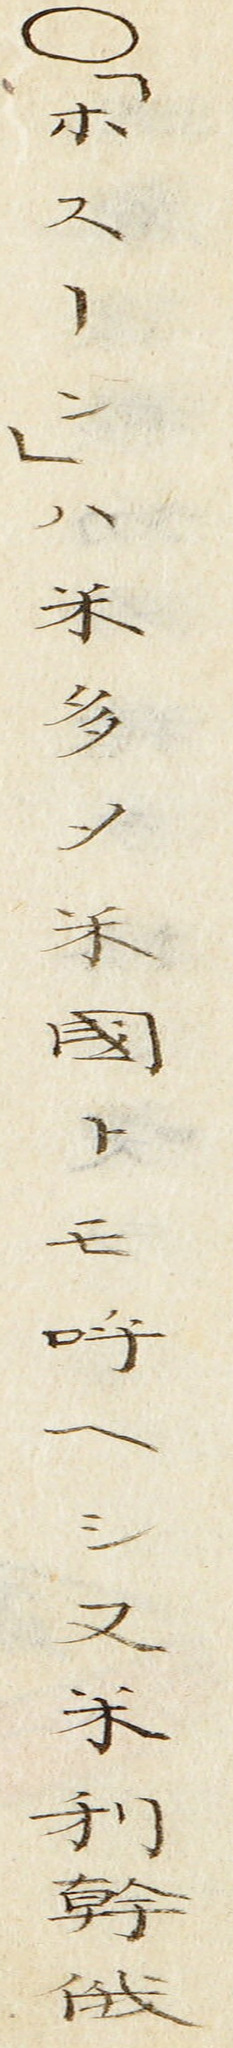〇「ホスーン」ハ米多シテ米国トモ呼ヘシ又米利幹俄
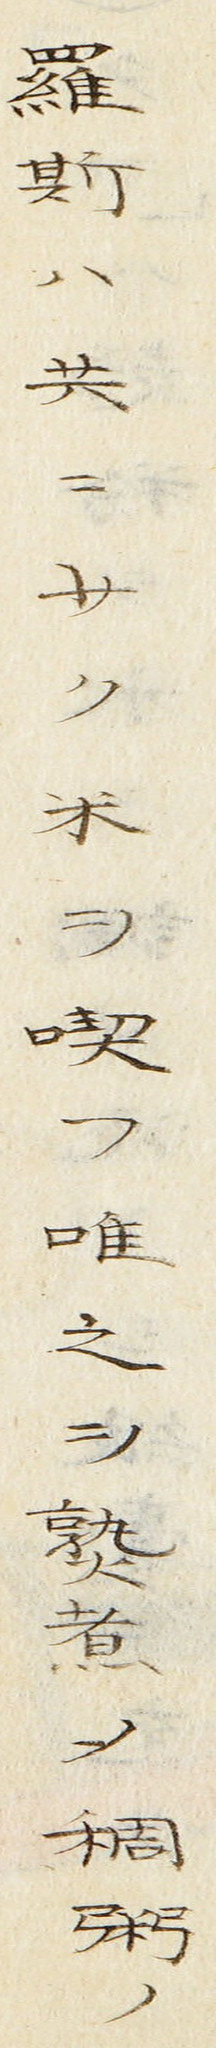羅斯ハ共ニ少ク米ヲ喫フ唯之ヲ熱煮シテ稠粥ノ
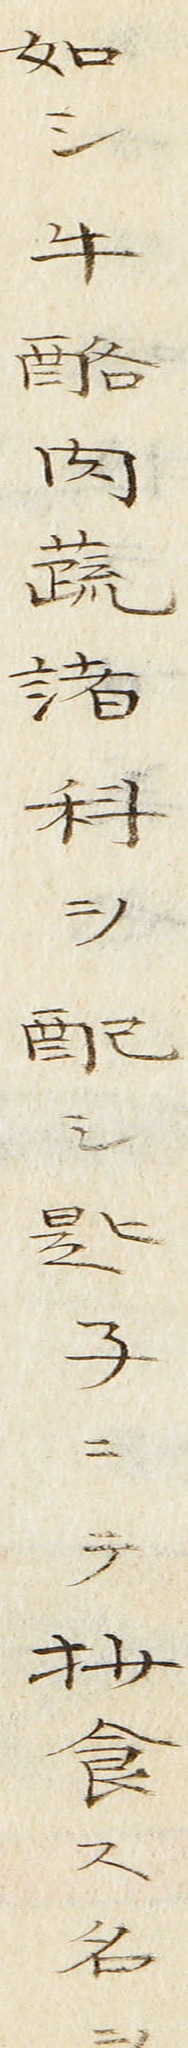如シ牛酪肉蔬諸科ヲ配シ匙子ニテ荘抄ス名ヲ
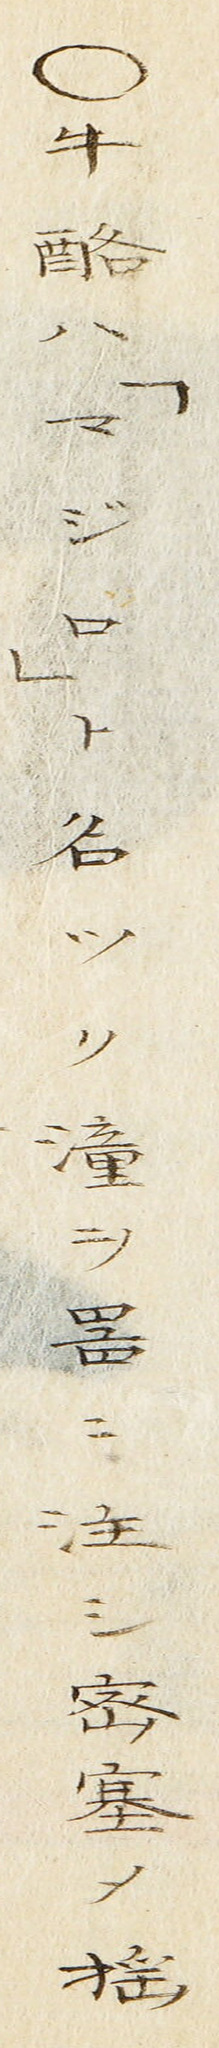〇牛酪ハ「マジロ」ト名ツク潼ヲ器ニ注シ密塞シテ揺
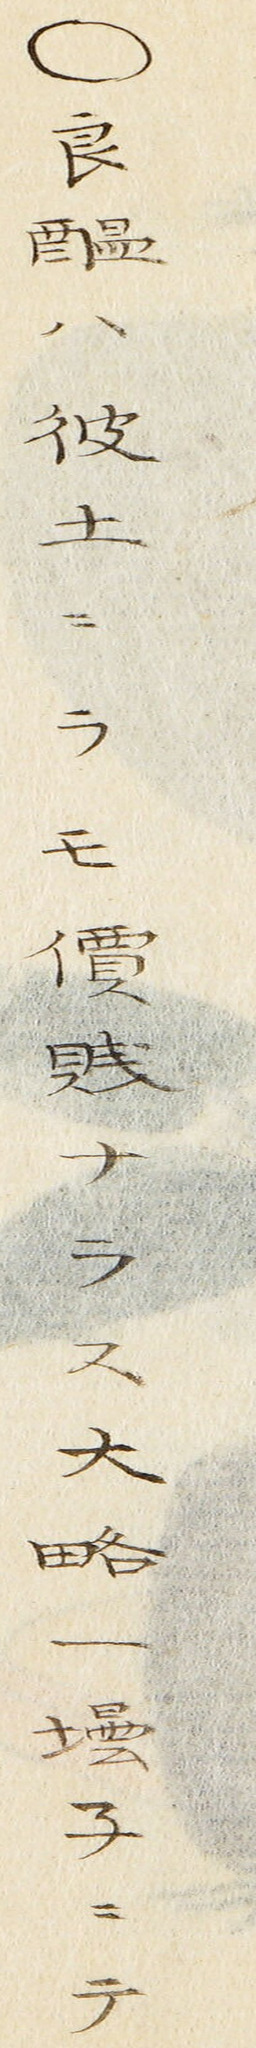〇良醞ハ彼土ニテモ価賤ナラス大略一壜子ニテ
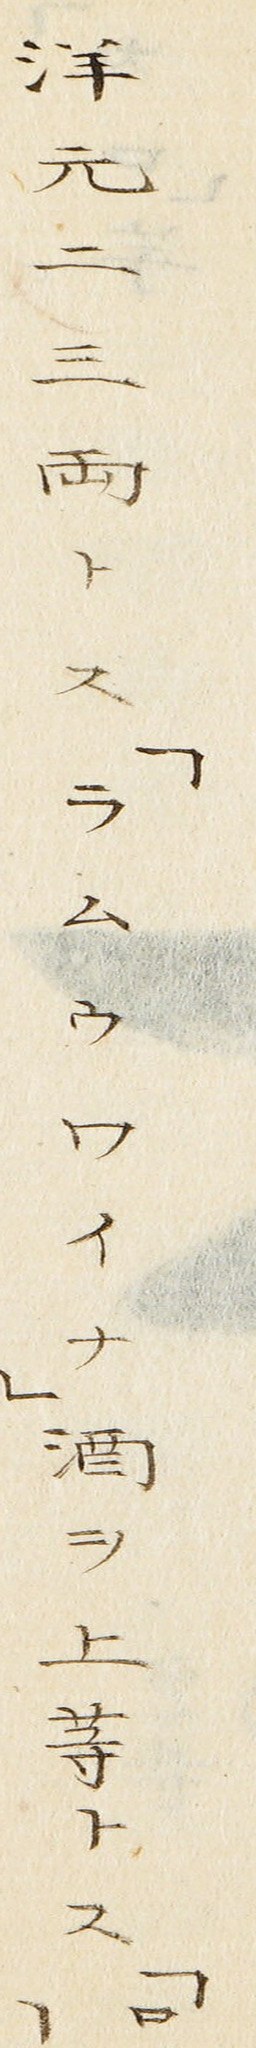洋元二三両トス「ラムウワイナ」酒ヲ上等トス「ロー
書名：蕃談
